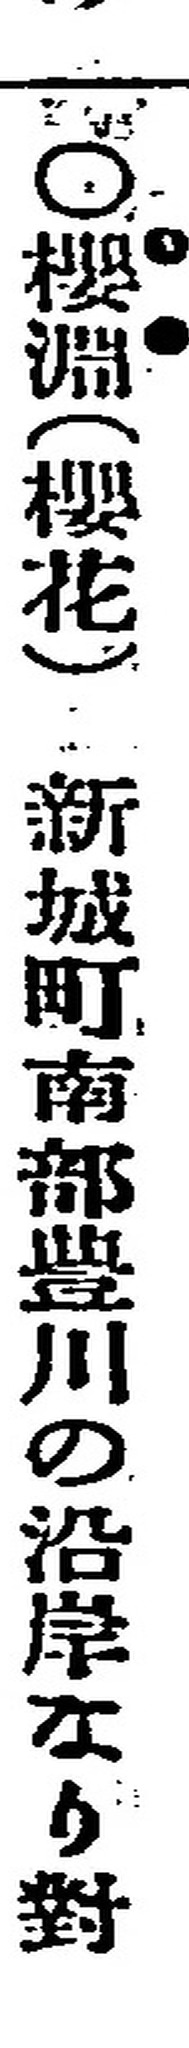○桜淵(桜花)新城町南部豊川の沿岸なり対
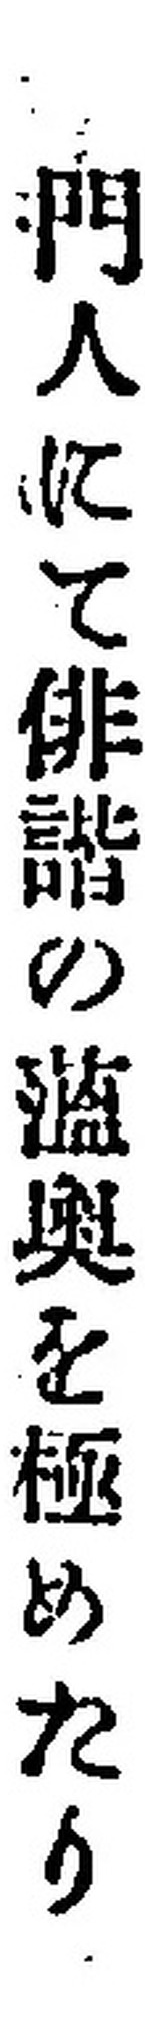門人にて俳諧の薀奥を極めたり
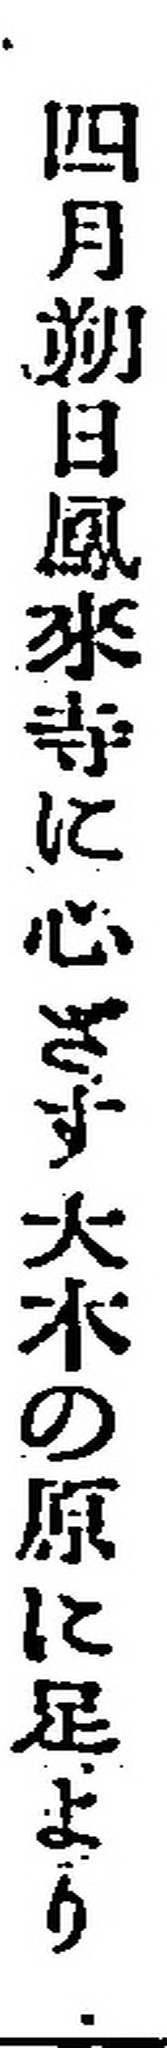四月朔日鳳来寺に心ざす大木の原に足より
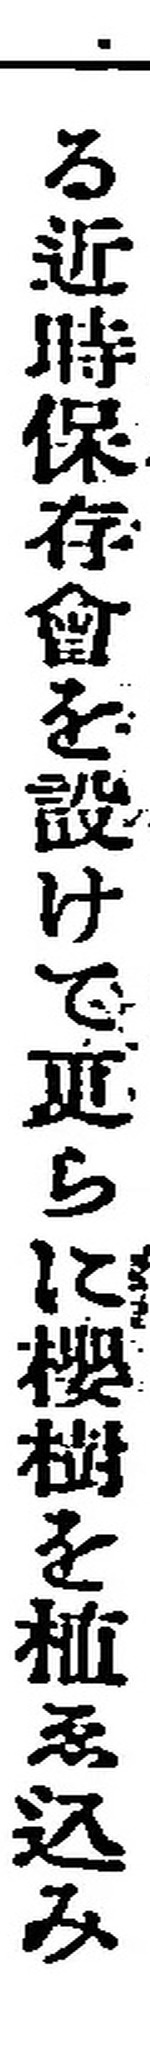る近時保存会を設けて更らに桜樹を植ゑ込み
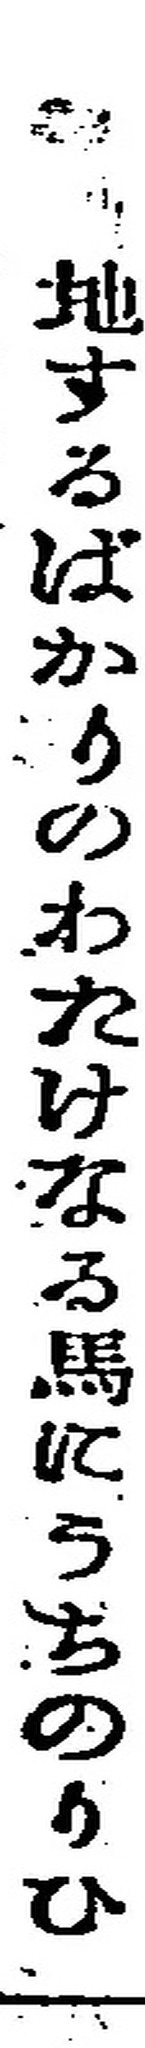地するばかりのわたけなる馬にうちのりひ
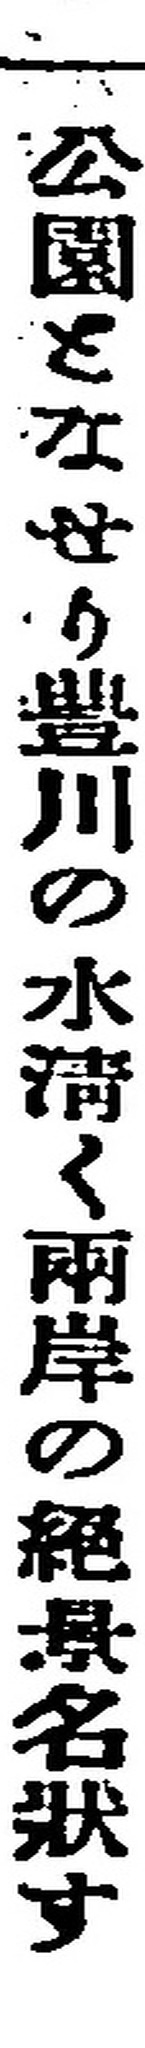公園となせり豊川の水清く両岸の絶景名状す
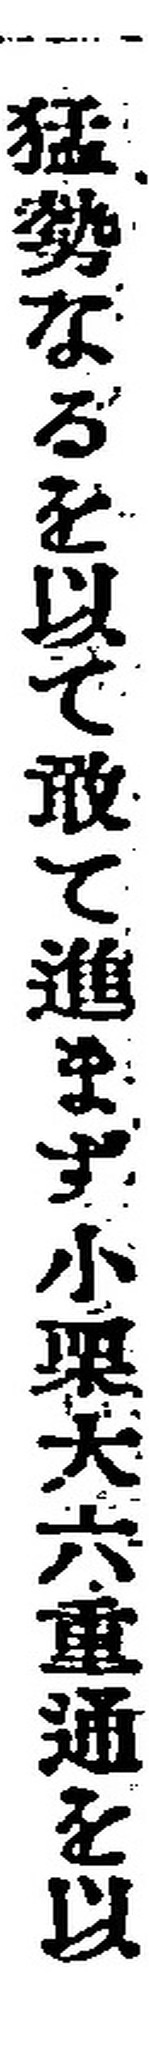猛勢なるを以て敢て進まず小栗大六重通を以
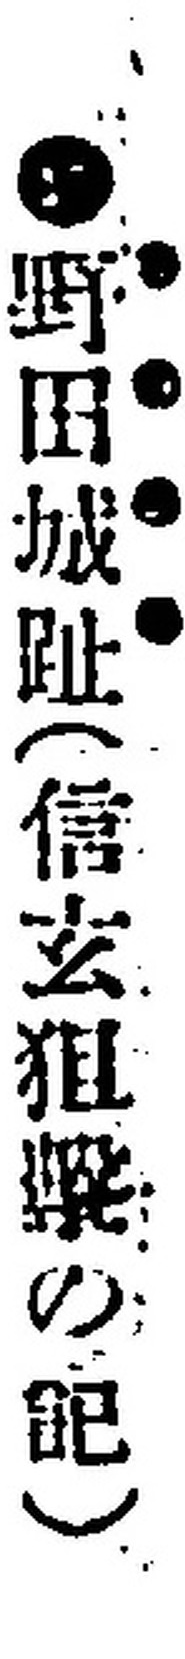●野田城趾(信玄狙撃の記)
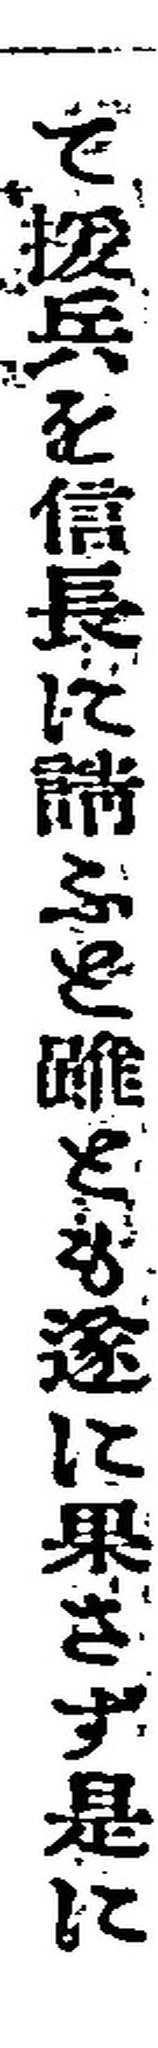て援兵を信長に請ふと雖とも遂に果さず是に
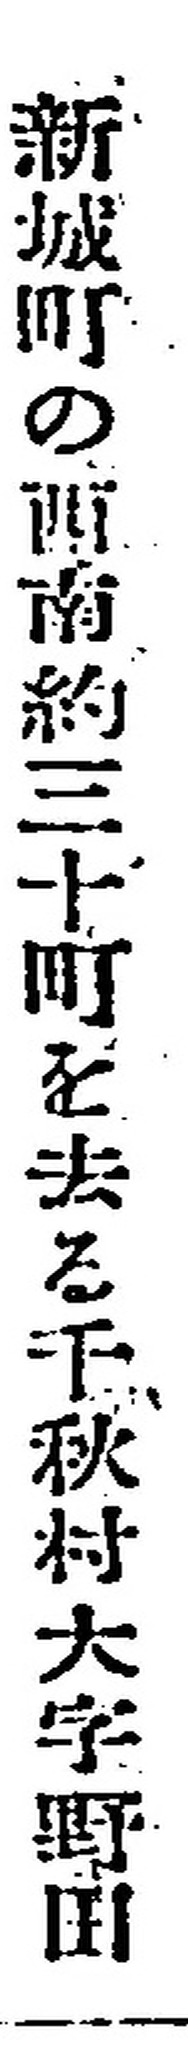新城町の西南約三十町を去る千秋村大字野田
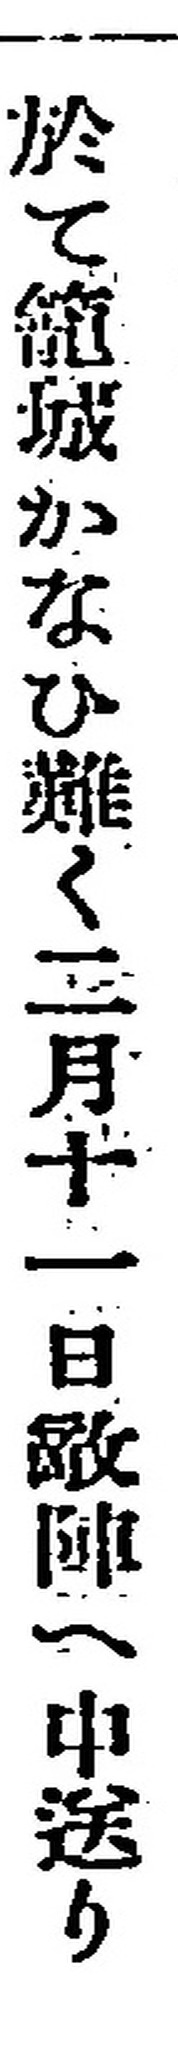於て籠城かなひ難く二月十一日敵陣へ申送り
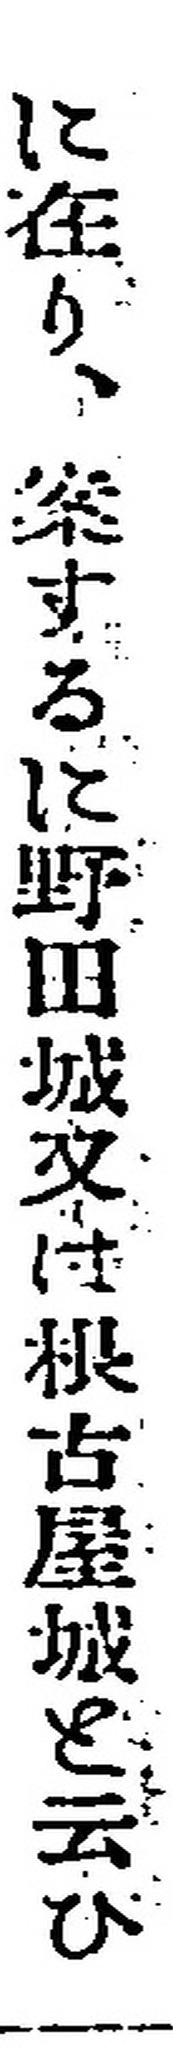に在り、案するに野田城又は根古屋城と云ひ
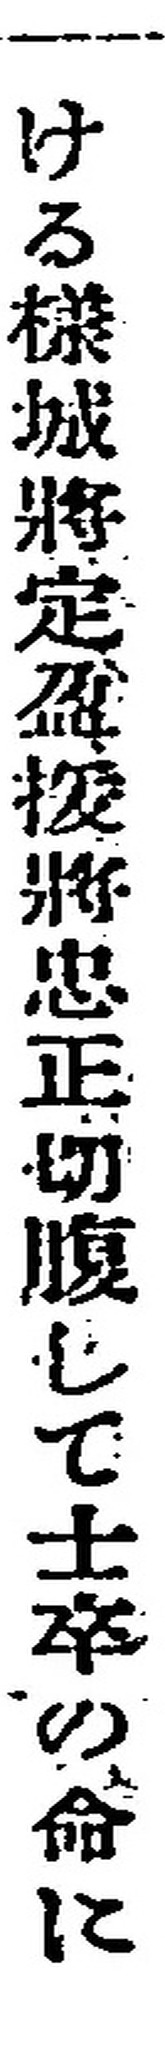ける様城将定盈援将忠正切腹して士卒の命に
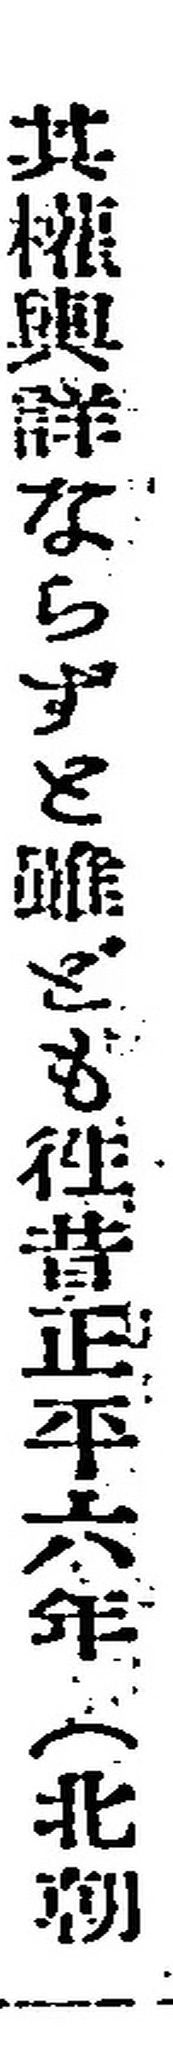其権輿詳ならずと雖ども往昔正平六年(北朝
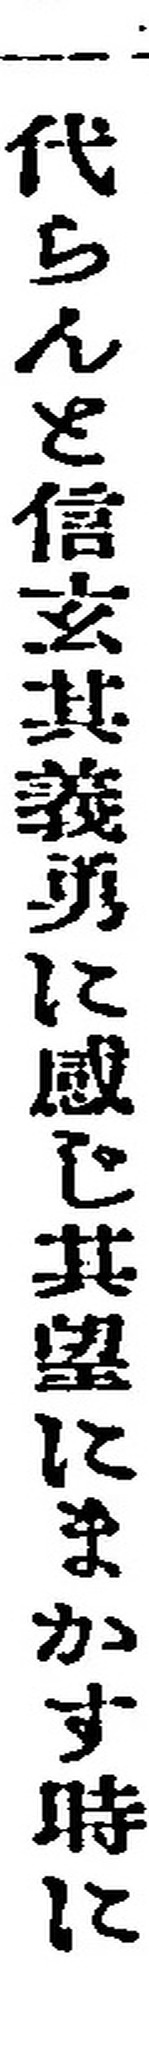代らんと信玄其義勇に感じ其望にまかす時に
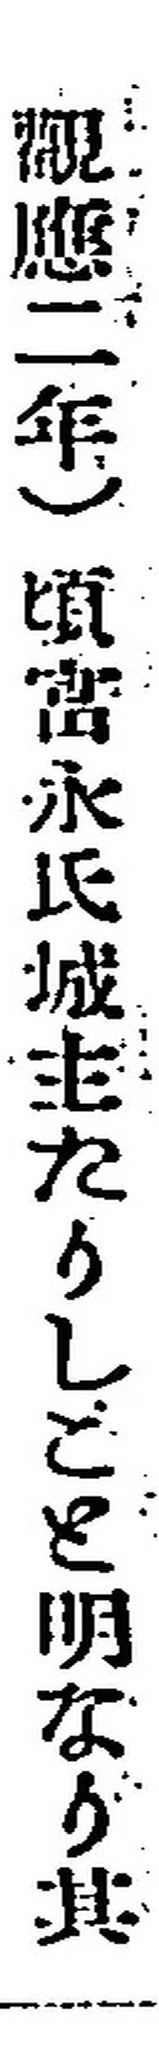観応二年)頃富永氏城主たりしこと明なり其
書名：東参名勝案内
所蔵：国立国会図書館 National Diet Library, JAPAN
